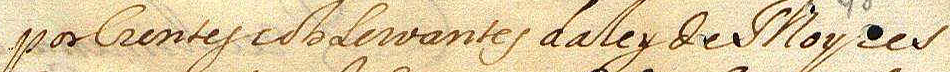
por Crentes e observantes da Ley de Moyses
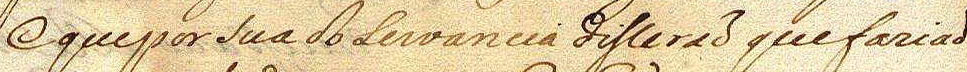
e que por sua observancia disseraõ que faziaõ
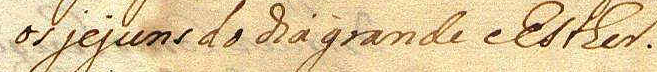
os jejuns do dia grande e Esther.
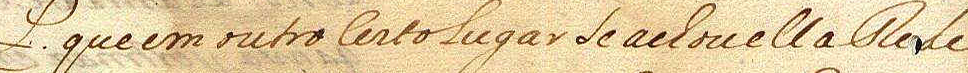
P. que em outro certo Lugar se achou ella Re de
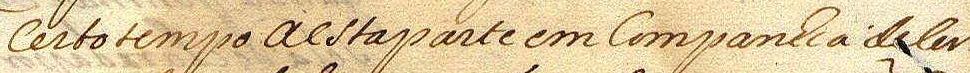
certo tempo a esta parte em companhia de cer
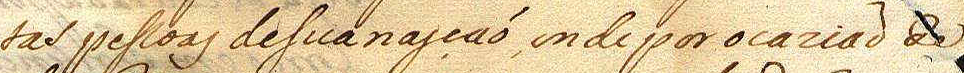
tas pessoas de sua nasçaõ, onde por ocaziaõ de
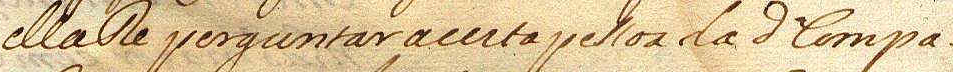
ella Re perguntar a certa pessoa da da compa
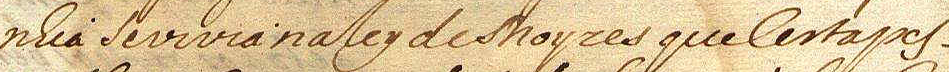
nhia se vivia na ley de Moyzes que certa pes
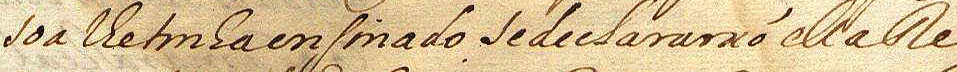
soa lhe tinha ensinado se declararaõ ella Re
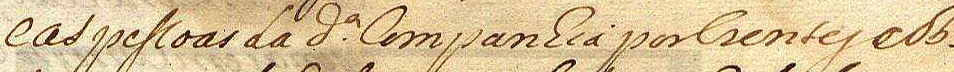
e as pessoas da d.a companhia por crentes e ob
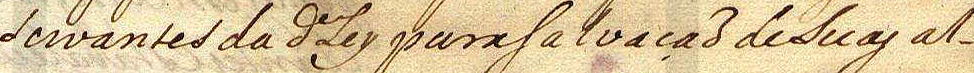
servantes da d.a Ley para salvaçaõ de Suas alm
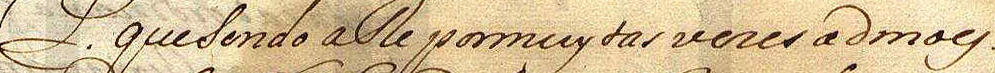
P. que sendo a Re por muytas vezes admoes
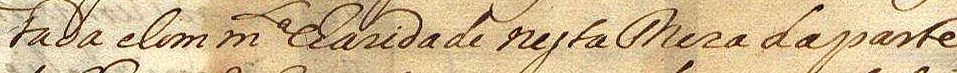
tada e com mta charidade nesta Meza da parte
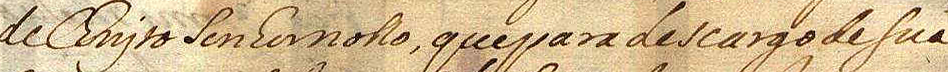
de Christo senhor nosso, que para descargo de sua
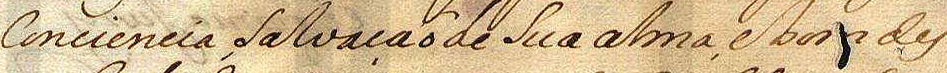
conciencia, salvaçaõ de sua alma, e bom des
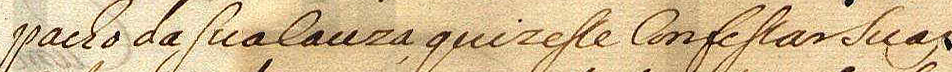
pacho da sua cauza, quizesse confessar suas
